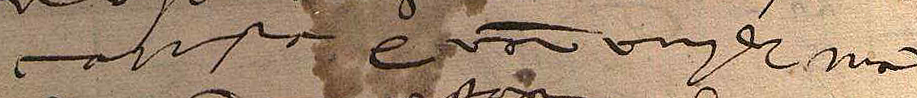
causa e o s̄r oujdor mā
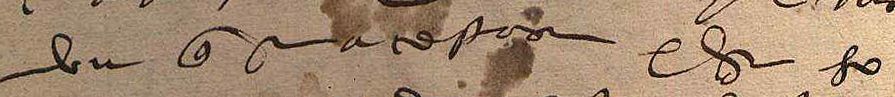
dou q̄ se acostase e he ho
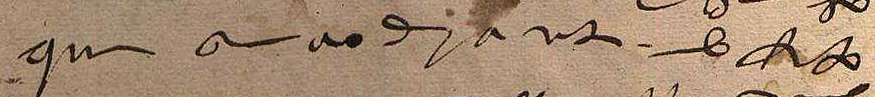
que se ao djante do feito
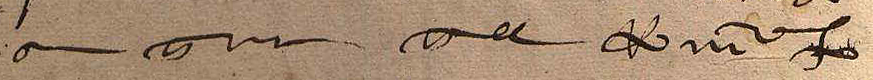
segue gill Romro ho
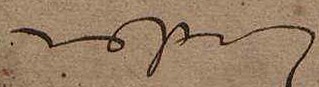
espuj
